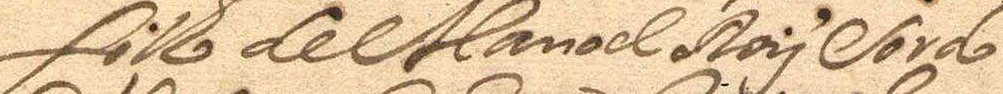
filho de Manoel Rois̄ Sordo
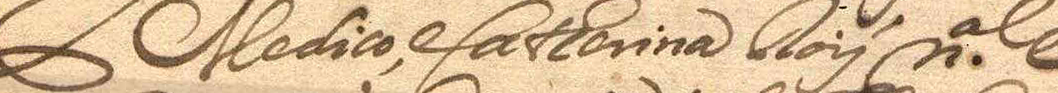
Medico, e Catherina Rois̄ n.al e
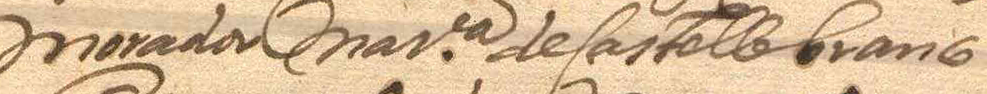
morador na v.a de Castello branco
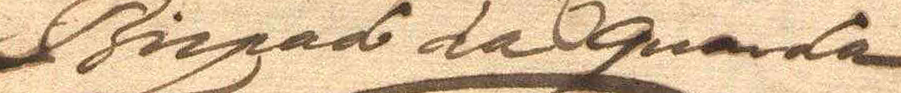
Bispado da Guarda
